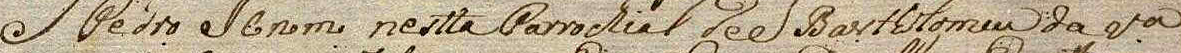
S Pedro Iconomo nestta Parrochial de S Bartholomeu da V.a
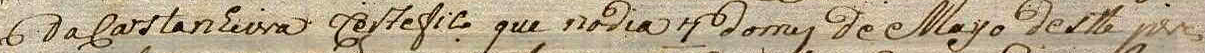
da Castanheira Certefico que no dia 7 do mes de Mayo destte pre
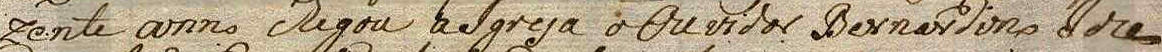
zente anno chegou a Igreja o Ouvidor Bernardino Ioze
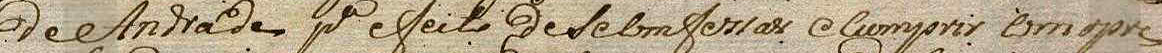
de Andrade pa efeito de se comfessar e cumprir com o pre
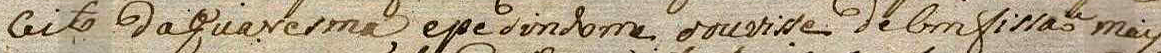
ceito da quaresma, e pedindome o ouvisse de comfissaõ mais
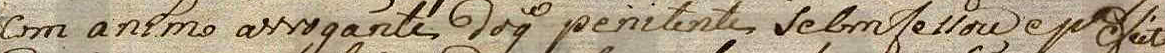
com animo arrogante do q̄ penitente se comfessou, e pa efeito
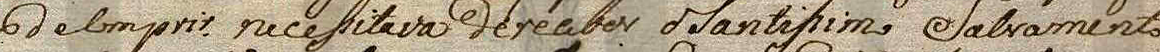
de comprir necessitava de receber o Santissimo Sacramento
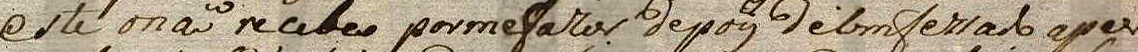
este o naõ reçebeo por me fazer depois de comfessado a per
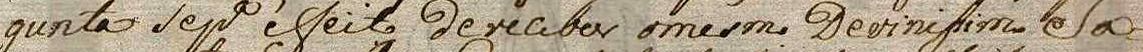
gunta se pa efeito de receber o mesmo Devinissimo Sa
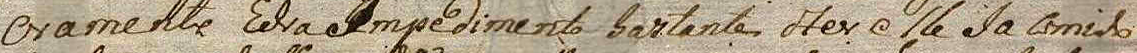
cramento hera Impedimento bastante o ter elle Ia comido
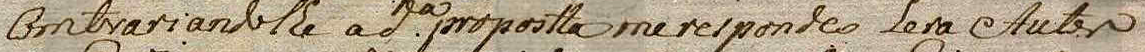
comtrariandolhe a da propostta me respondeo Lera Autor
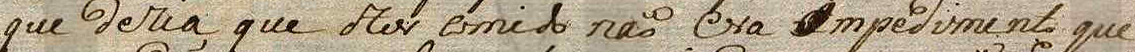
que dezia, que o ter comido naõ era Impedimento que
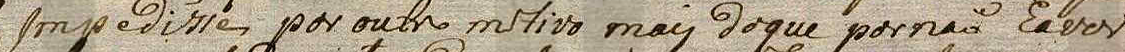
Jmpedisse por outro motivo mais do que por naõ haver
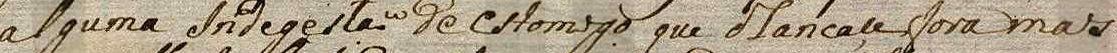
alguma Indegestaõ de estomago que o lancaçe fora mas
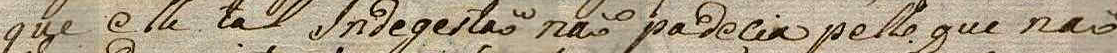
que elle tal Indegestaõ naõ padeçia pello que naõ
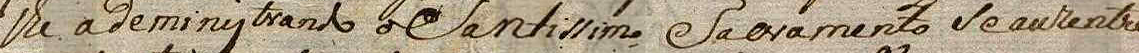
lhe adeministrando o Santissimo Sacramento se auzenthou
